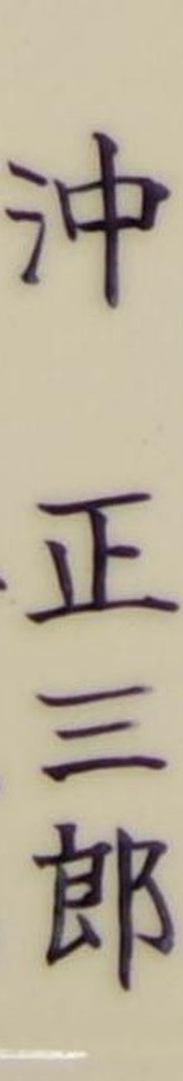沖正三郎
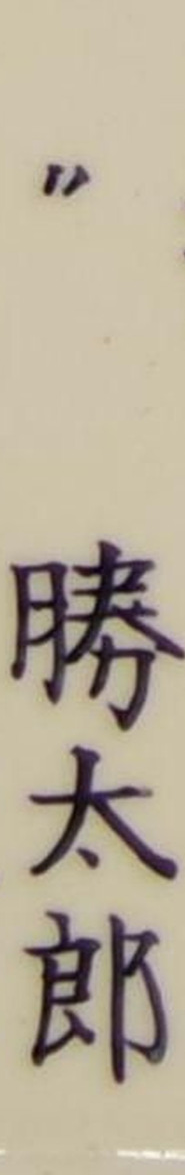勝太郎
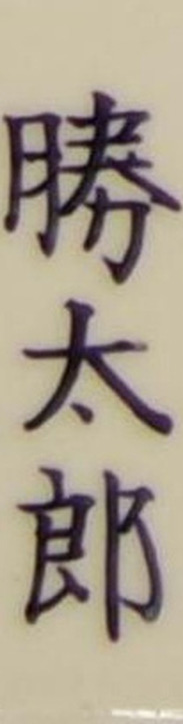勝太郎
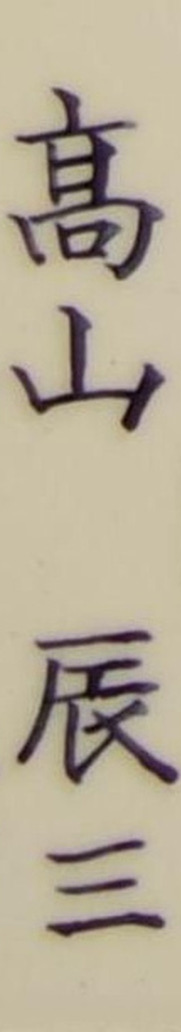高山辰三
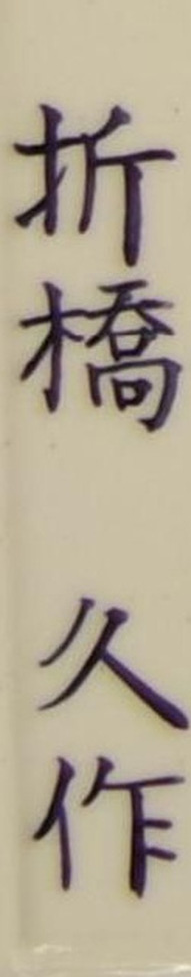折橋久作

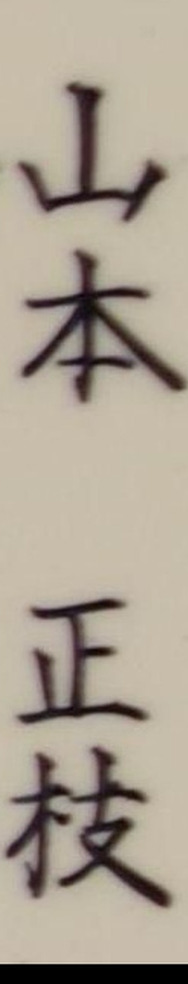山本正枝
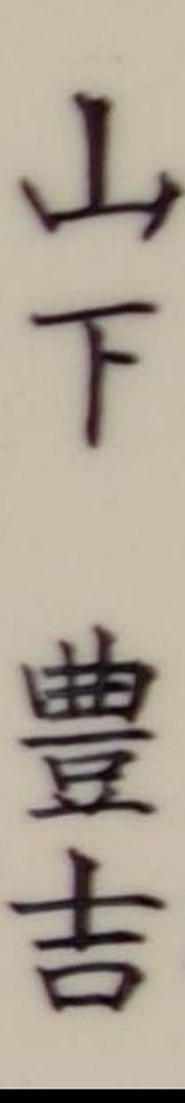山下豊吉
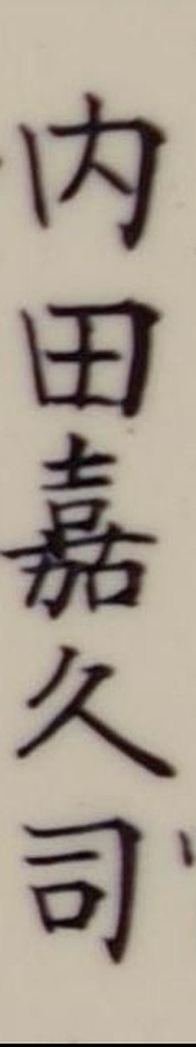内田嘉久司
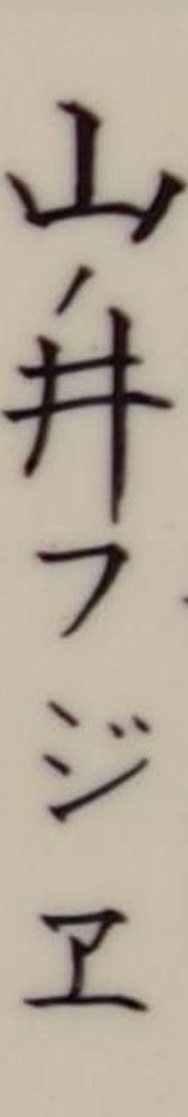山ノ井フジエ
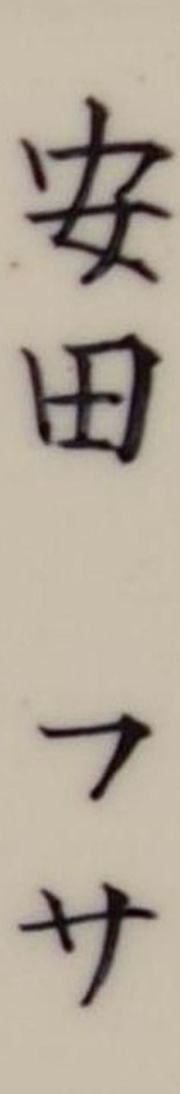安田フサ
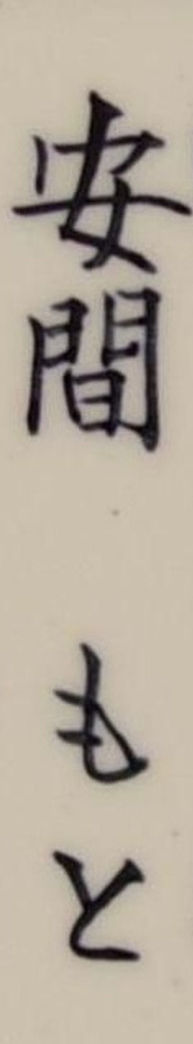安間もと
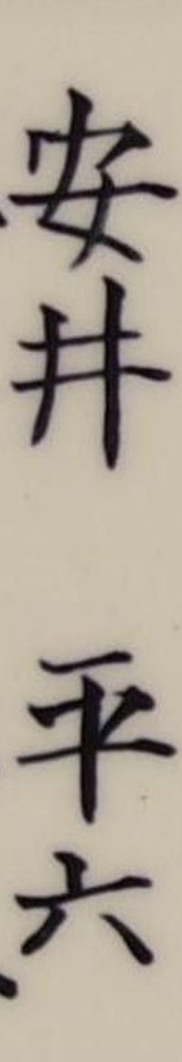安井平六
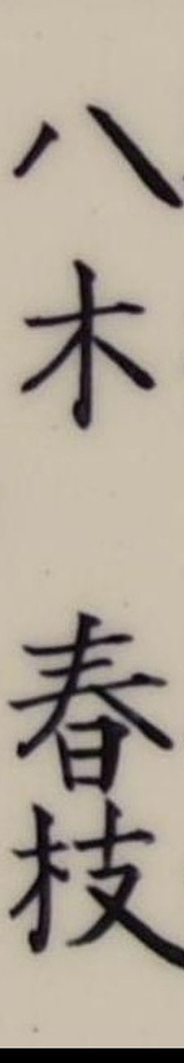八木春枝
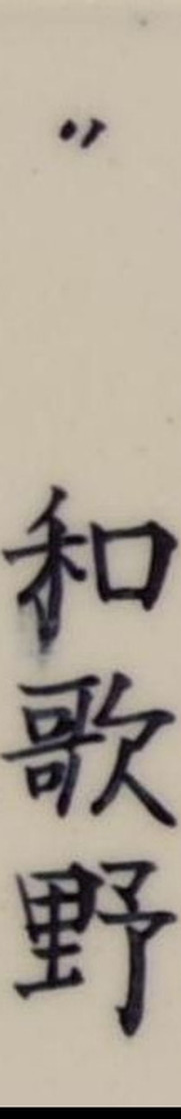和歌野
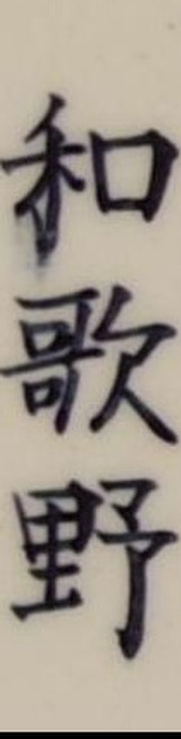和歌野
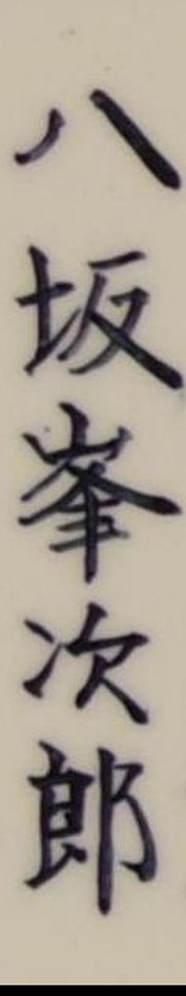八坂峯次郎
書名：E~L
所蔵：高野山金剛峯寺
